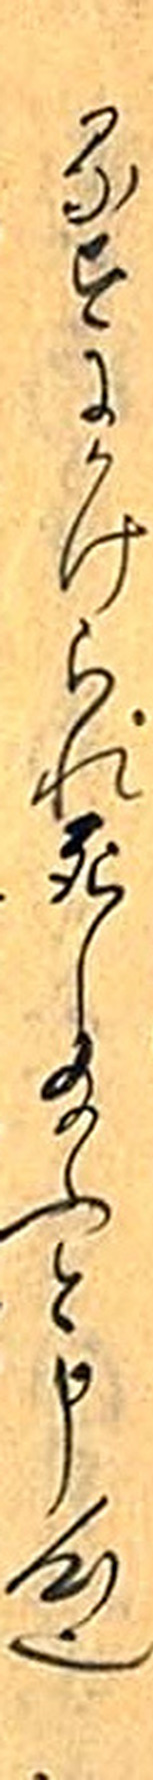るすにかけられ死し給ふと申心也
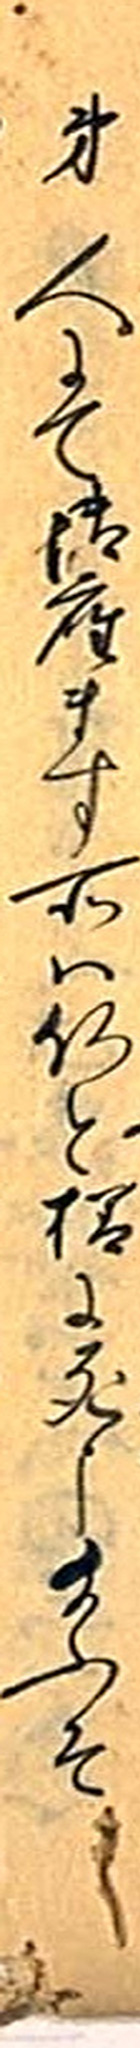弟人にて御座ます所は何と様に死し給ふそ
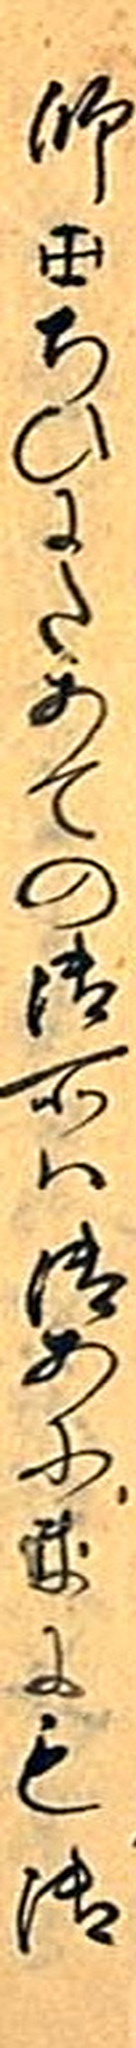師☩ちひにたあての御所は御あにまにも御
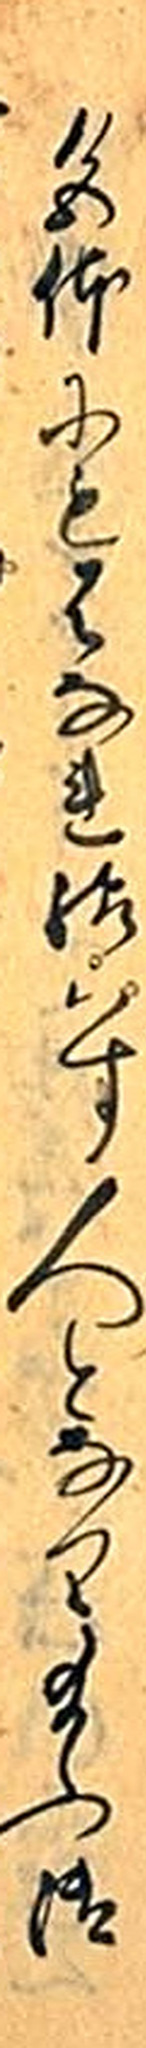色体にもはなれ給はす人となり給ふ御
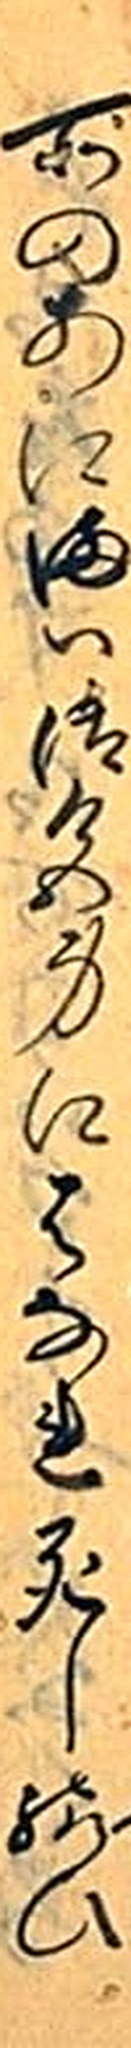所のあにまは御色身にはなれ死し給ひ
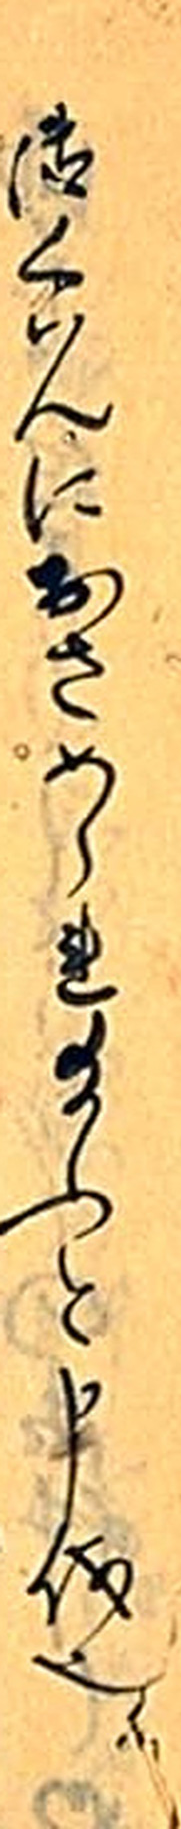御くはんにおさめられ給ふと申儀也
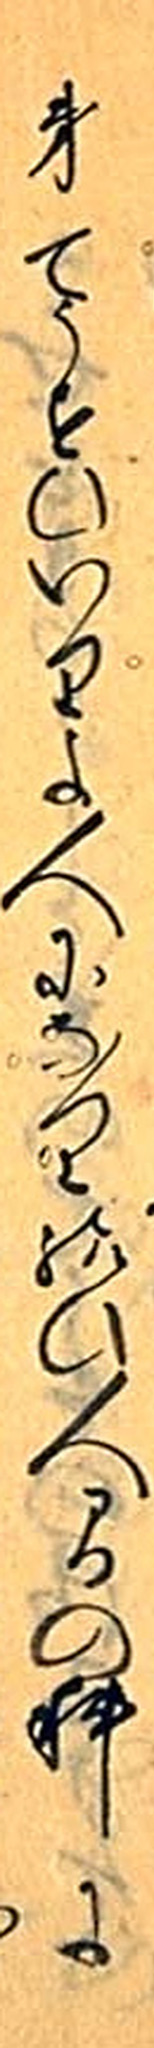弟てうすひいりよ人になり給ひ人間の科に
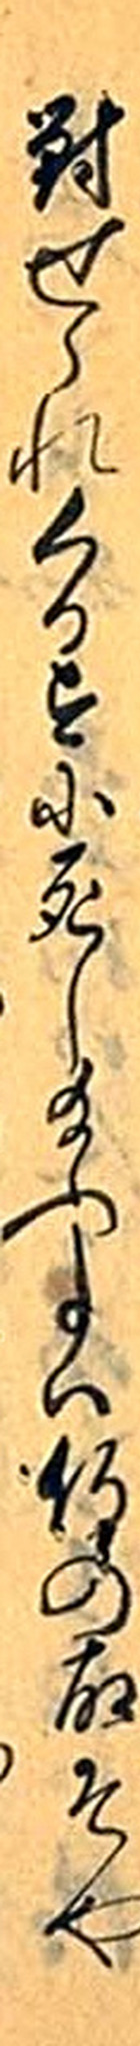対せられくるすに死し給ふ事は何の故そや
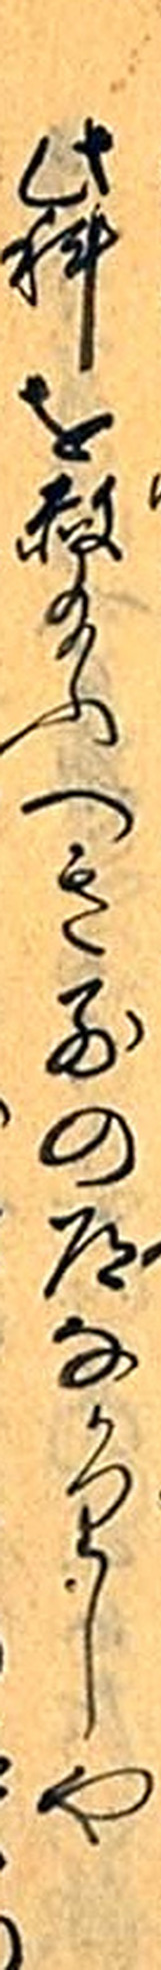此科を赦給ふへき別の道なかりしや
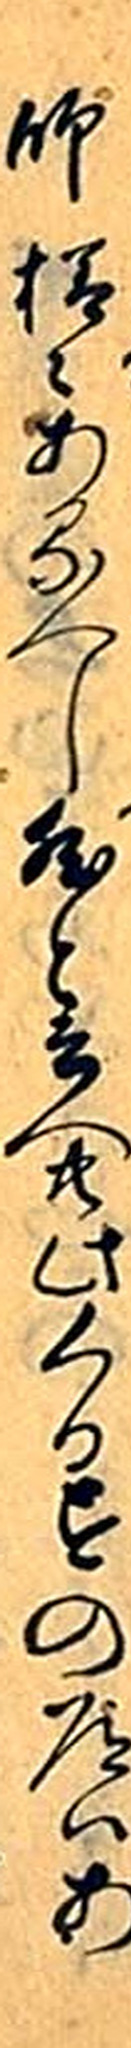師様々あるへし然と云へ共此くるすの道はあ
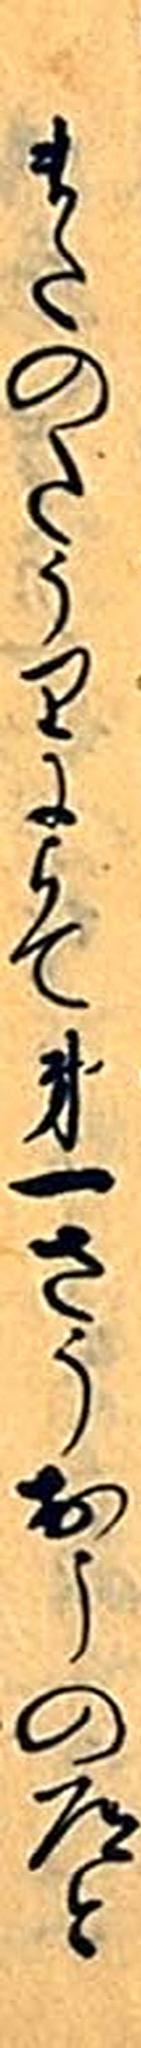またのたうりによて第一さうおうの道と
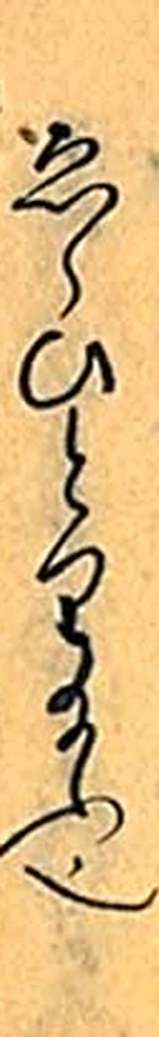えらひとり給ふ也
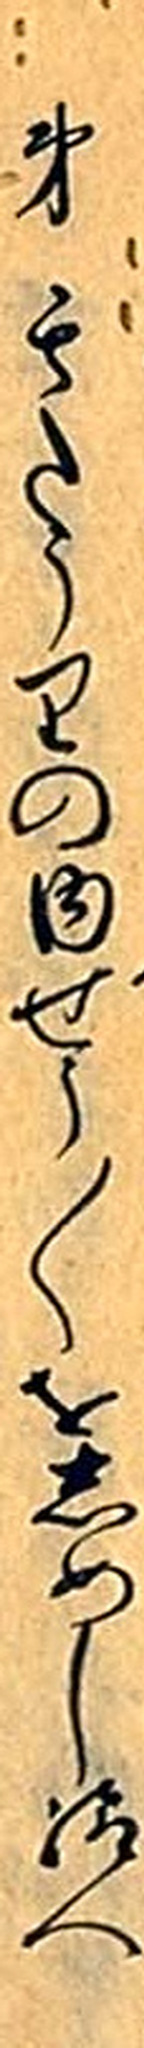弟其たうりの内せう〳〵をしめし給へ
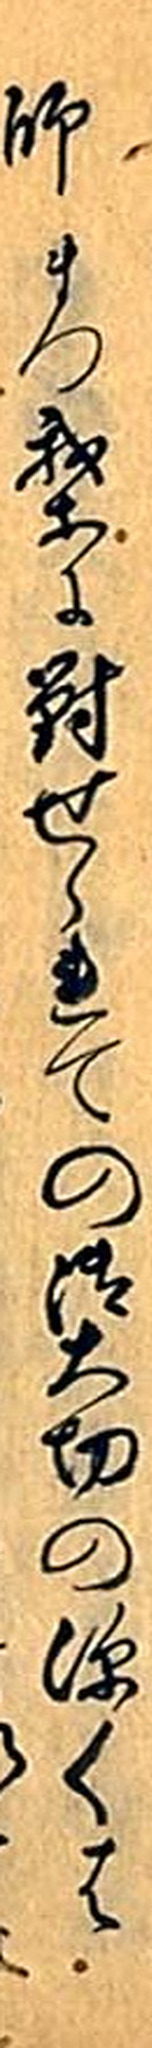師まつ我等に対せられての御大切の深くは
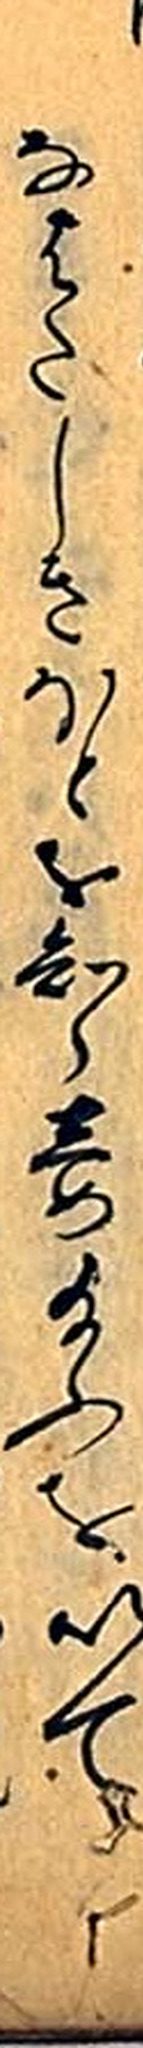なはたしきほとを知らしめ給ふを以て
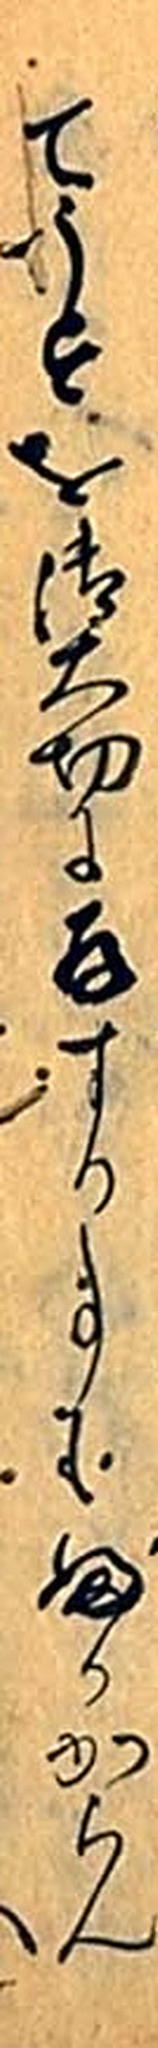てうすを御大切に存する事もふかからん
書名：ドチリナ・キリシタン
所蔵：東京大学総合図書館 / General Library in the University of Tokyo
